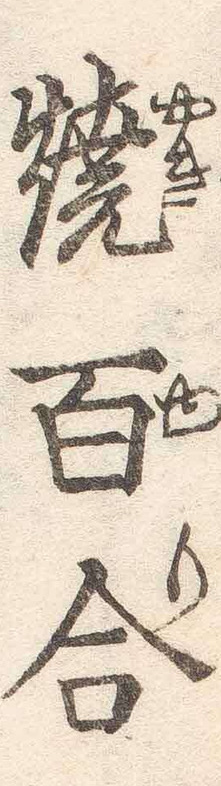焼百合
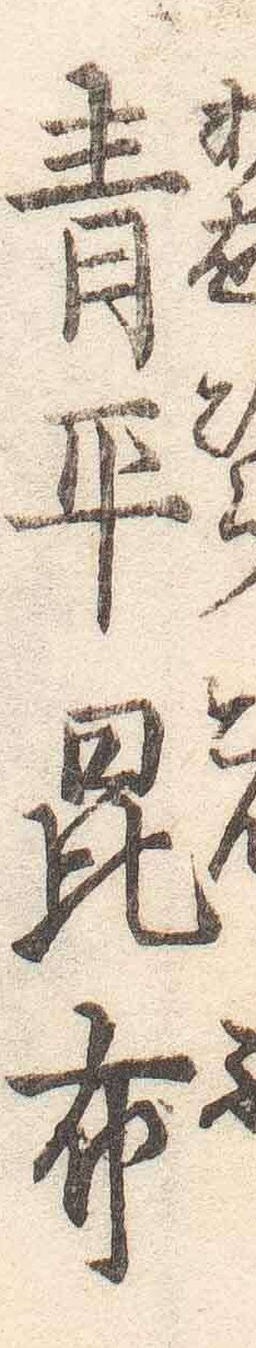青平昆布
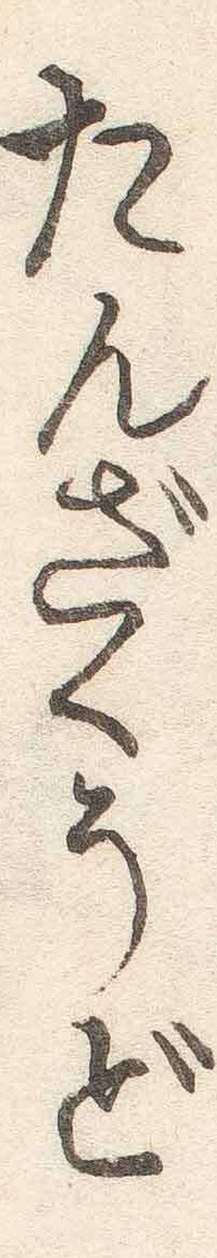たんざくうど
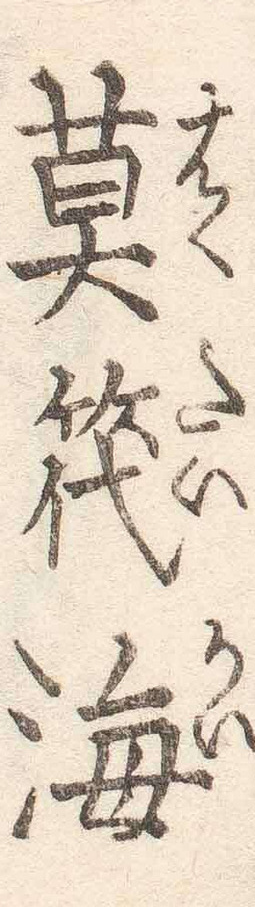莫筏海
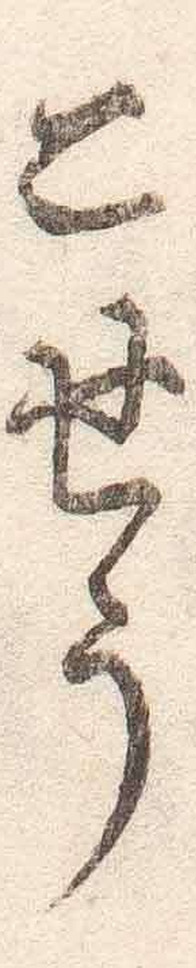こせう
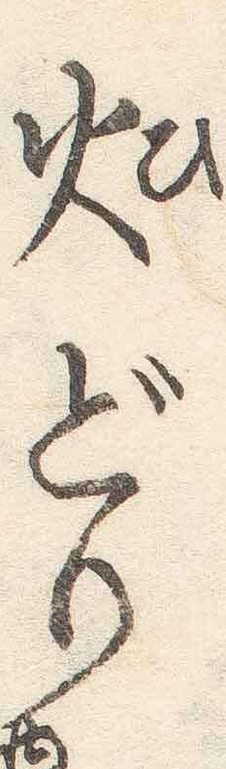火どり
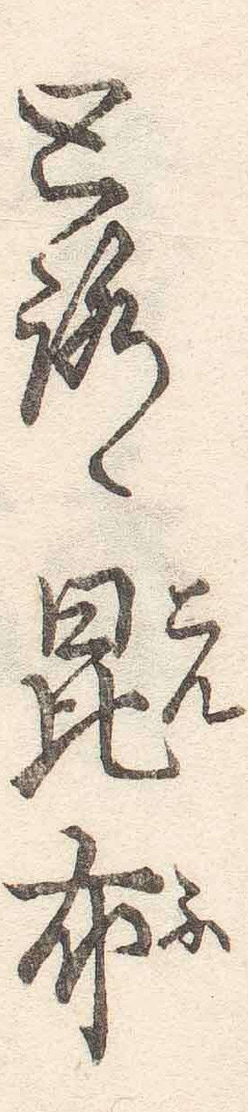とろゝ昆布
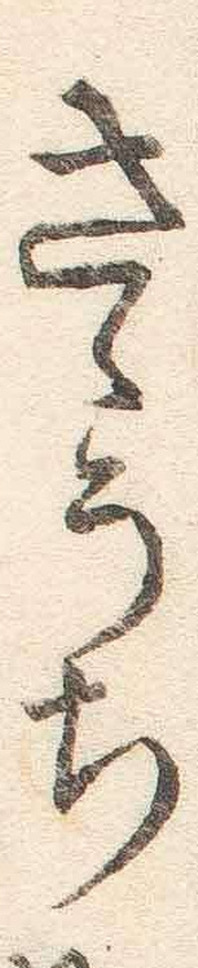さゝうち
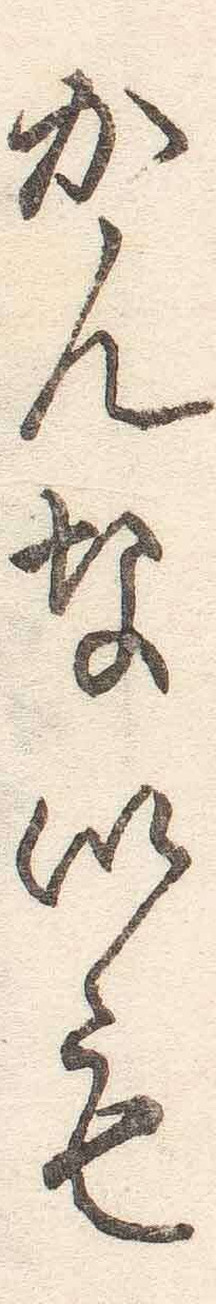かんないも
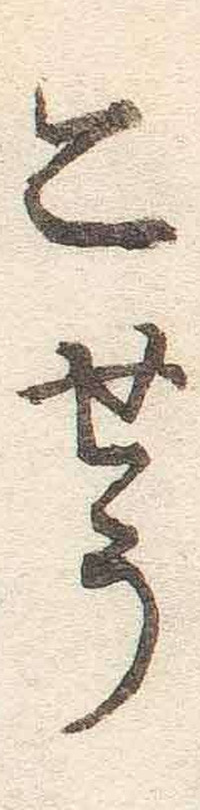こせう
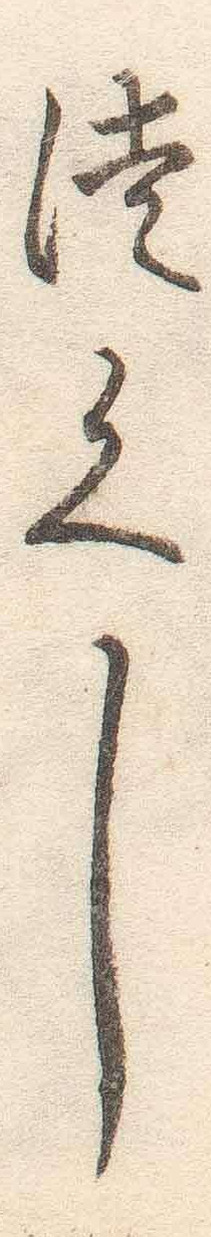つくし
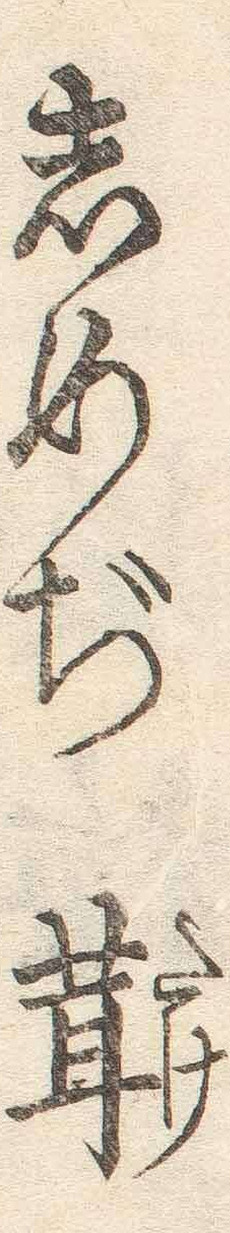しめぢ茸
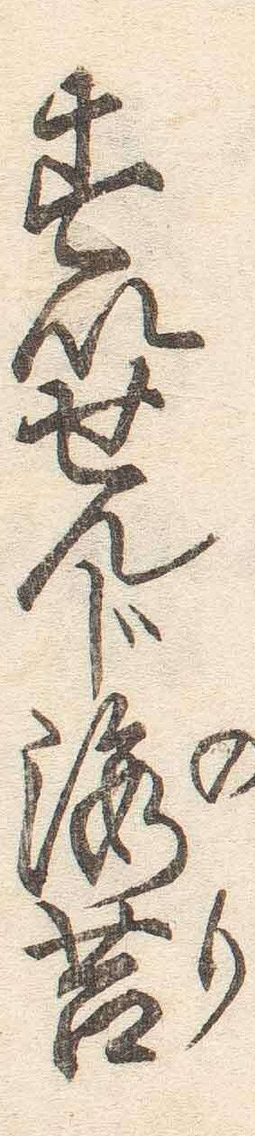すいせんじ海苔
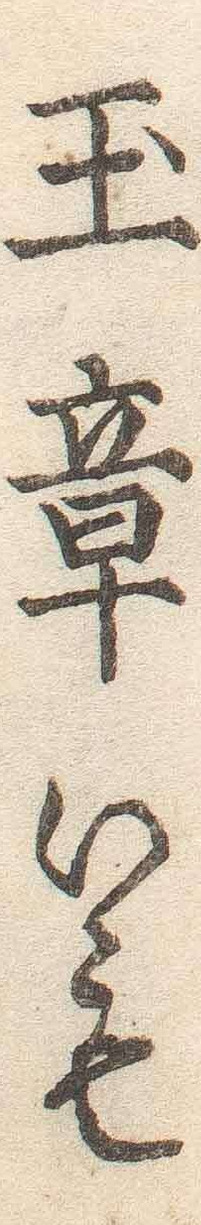玉章いも
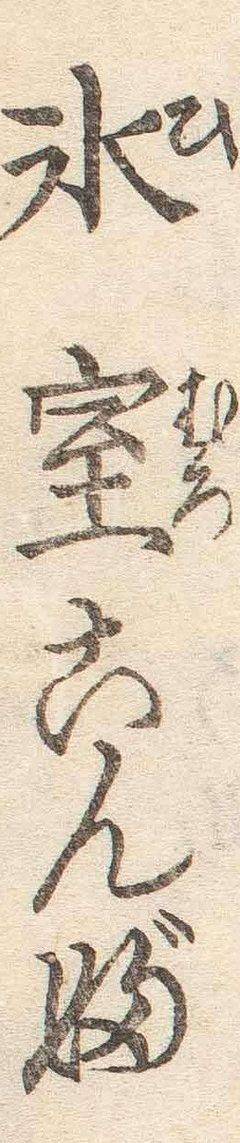氷室こんぶ
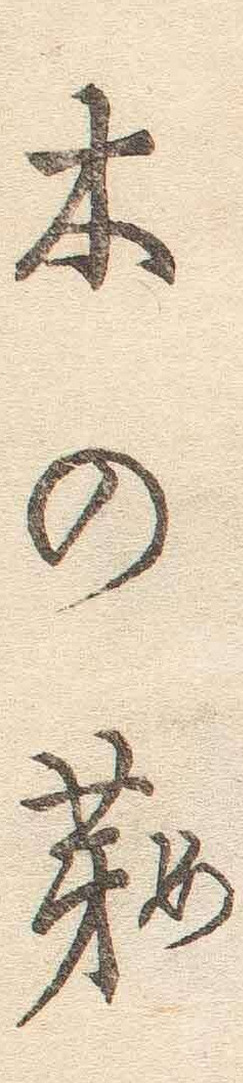木の芽
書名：料理通
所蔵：東京学芸大学附属図書館 国文学研究資料館
